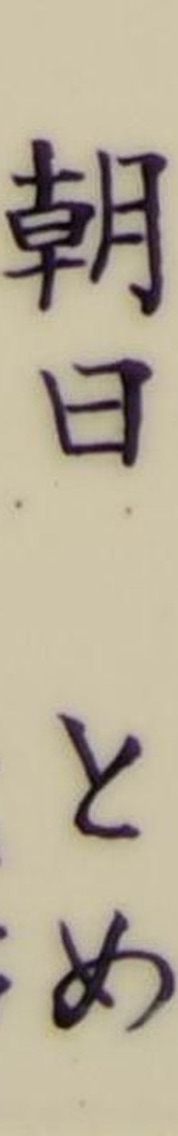朝日とめ

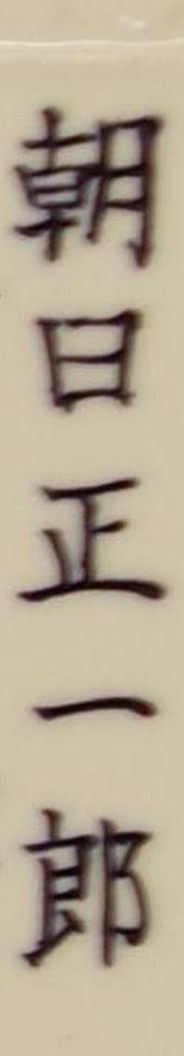朝曰正一郎
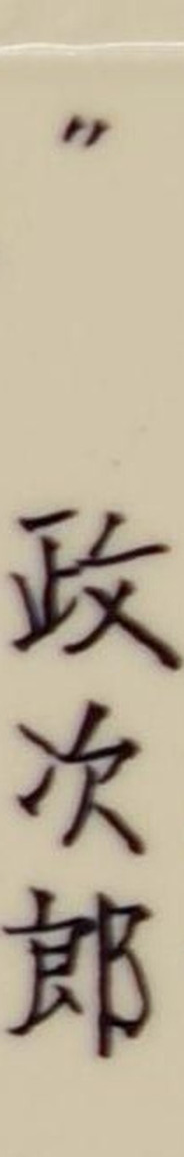政次郎
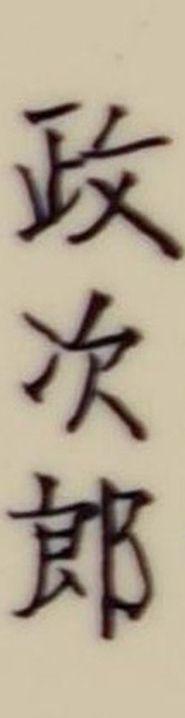政次郎
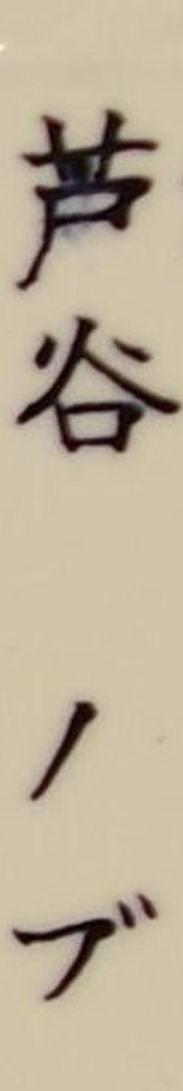芦谷ノブ
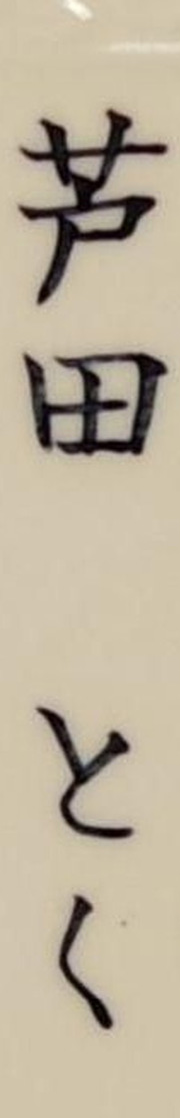芦田とく
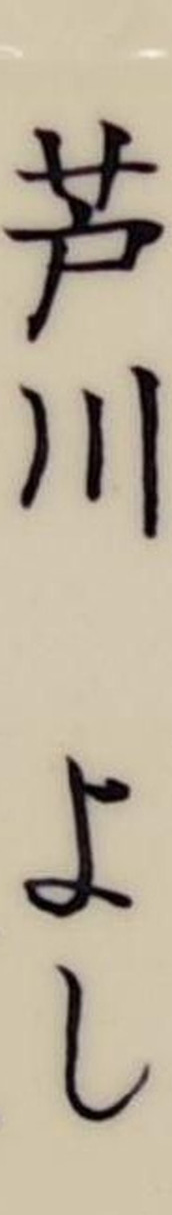芦川よし
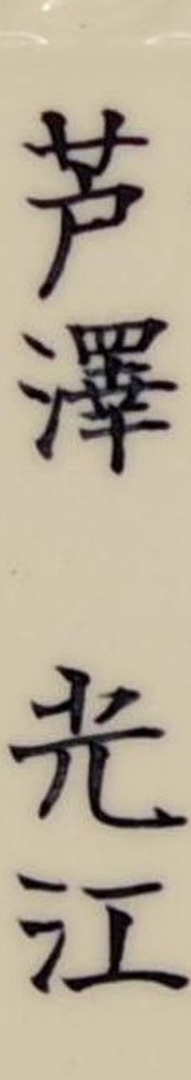芦澤光江
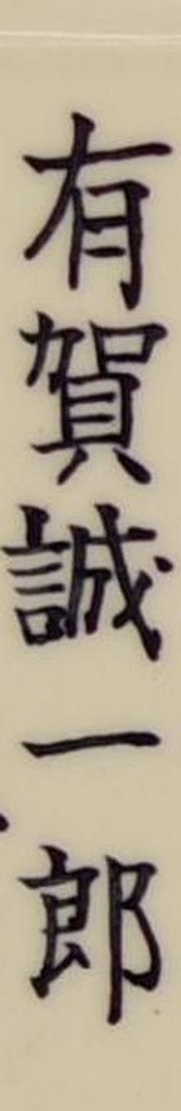有賀誠一郎
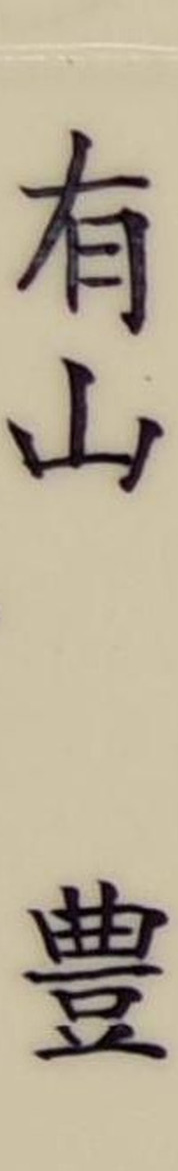有山豊
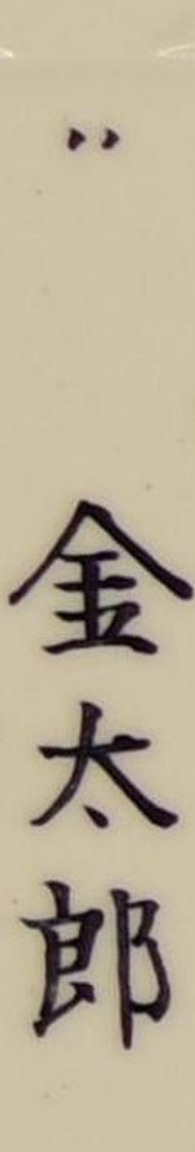金太郎
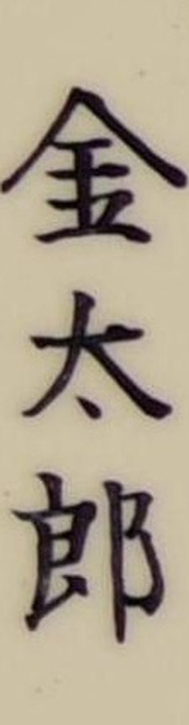金太郎
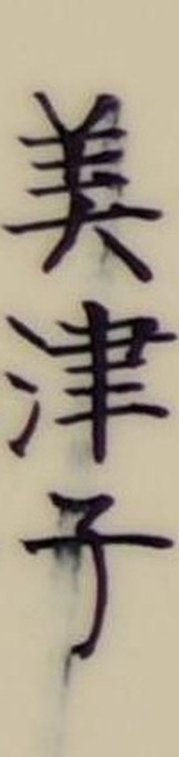美津子
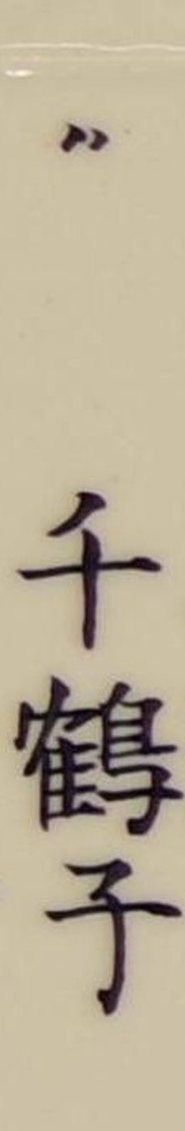千鶴子
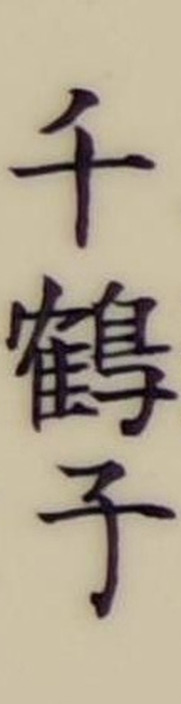千鶴子
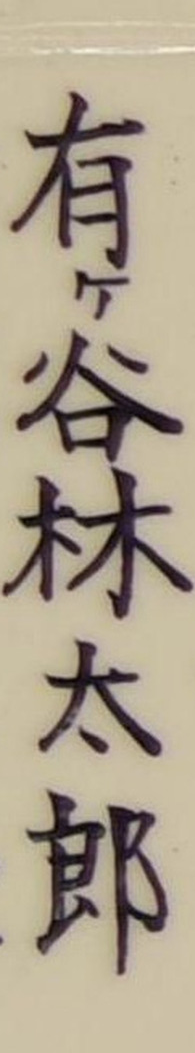有ヶ谷林太郎
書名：E~L
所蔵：高野山金剛峯寺
